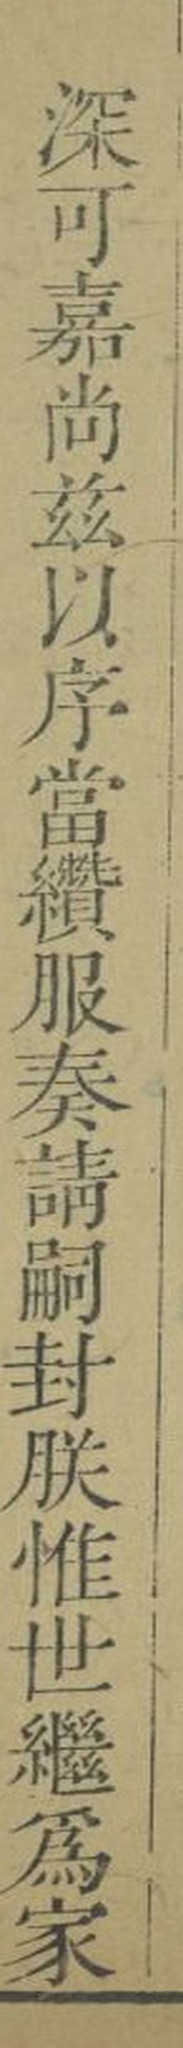深可嘉尚茲以序當纘服奏請嗣封朕惟世繼爲家
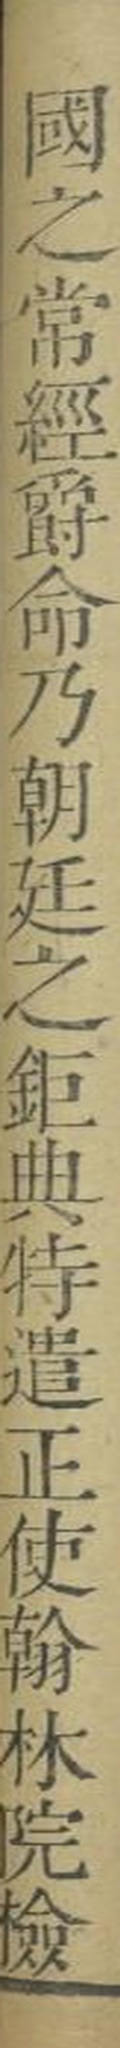國之常經爵命乃朝廷之鉅典特遣正使翰林院檢
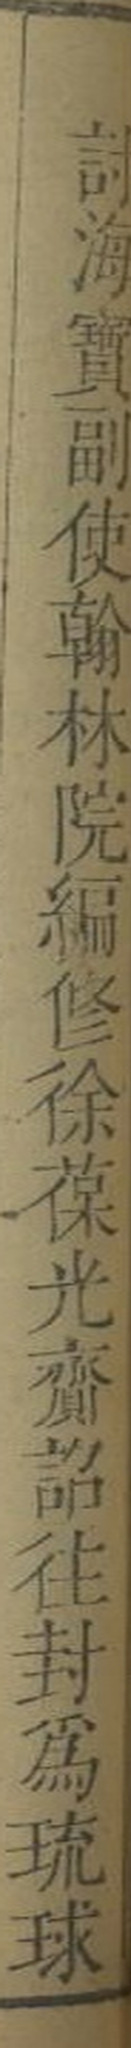討海寶副使翰林院編修徐葆光齎詔往封爲琉球
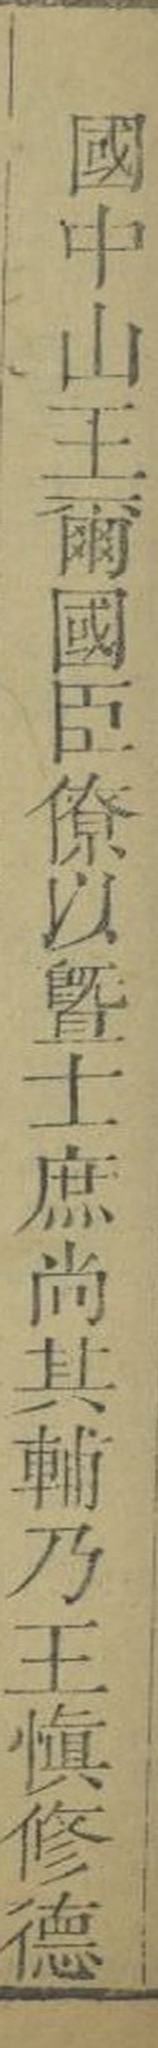國中山王爾國臣僚以曁士庶尚其輔乃王愼修德
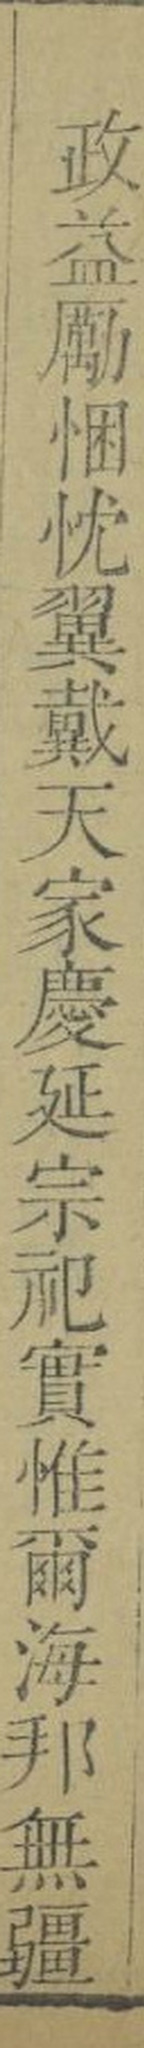政益勵悃忱翼戴天家慶延宗祀實惟爾海邦無疆
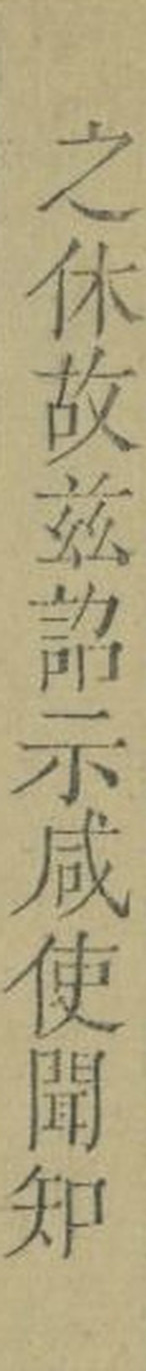之休故茲詔示咸使聞知
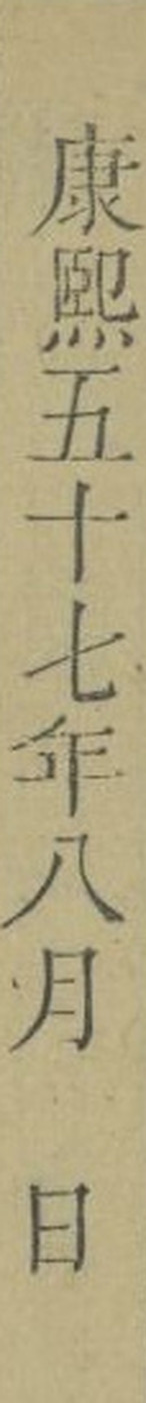康煕五十七年八月日
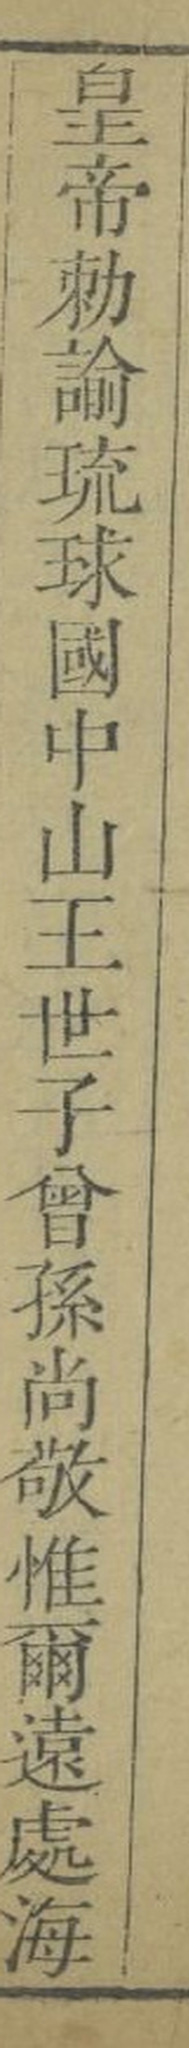皇帝勅諭琉球國中山王世子曾孫尚敬惟爾遠處海
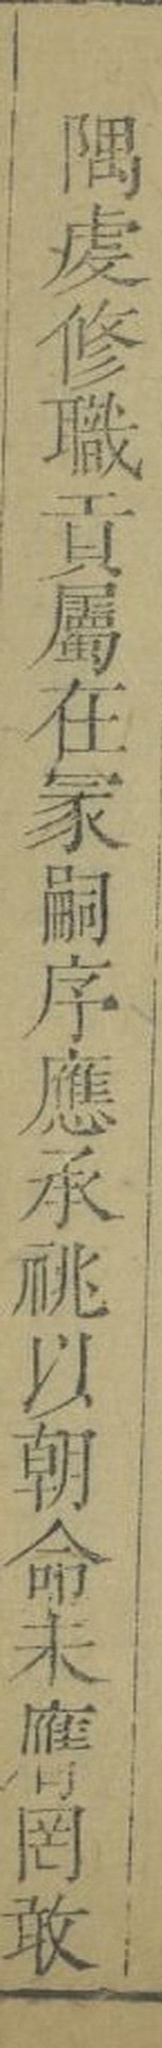隅虔修職貢屬在冡嗣序應承祧以朝命未膺罔敢
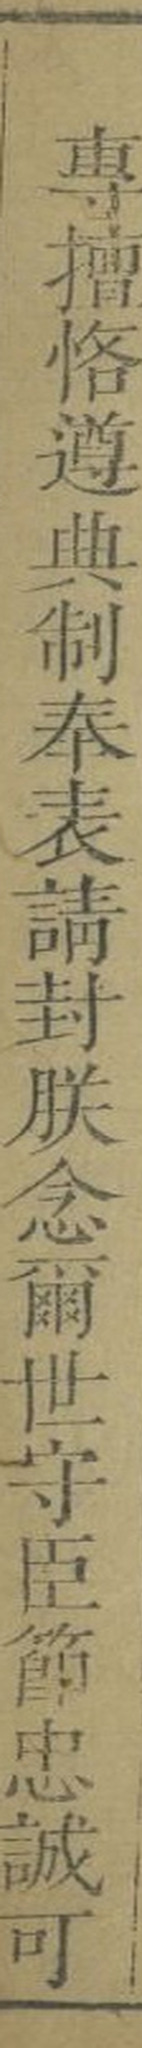專擅悋遵典制奉表請封朕念爾世守臣節忠誠可

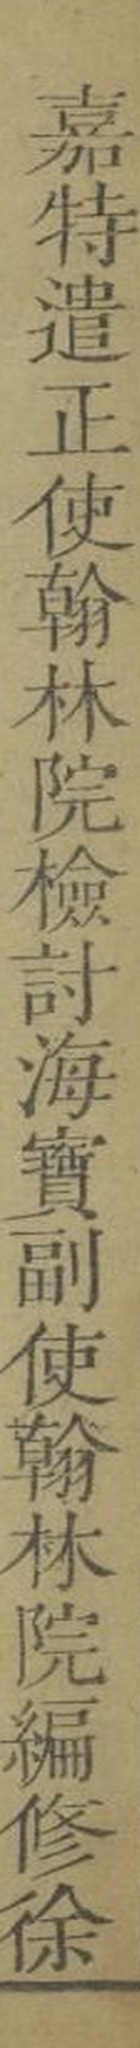嘉特遣正使翰林院檢討海寶副使翰林院編修徐
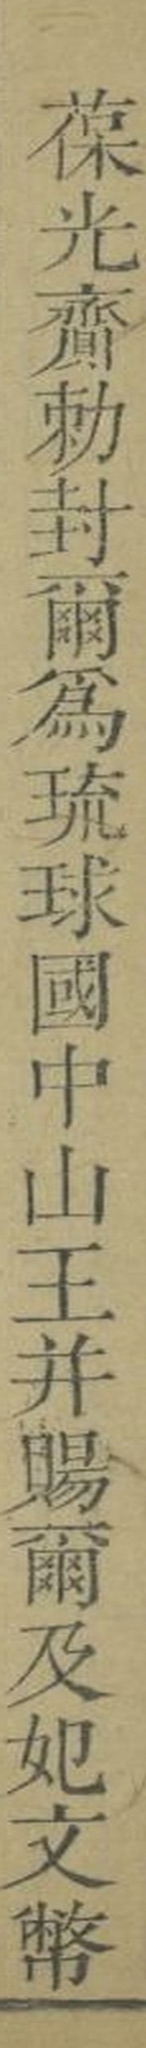葆光齎勅封爾爲琉球國中山王并賜爾及妃文幣
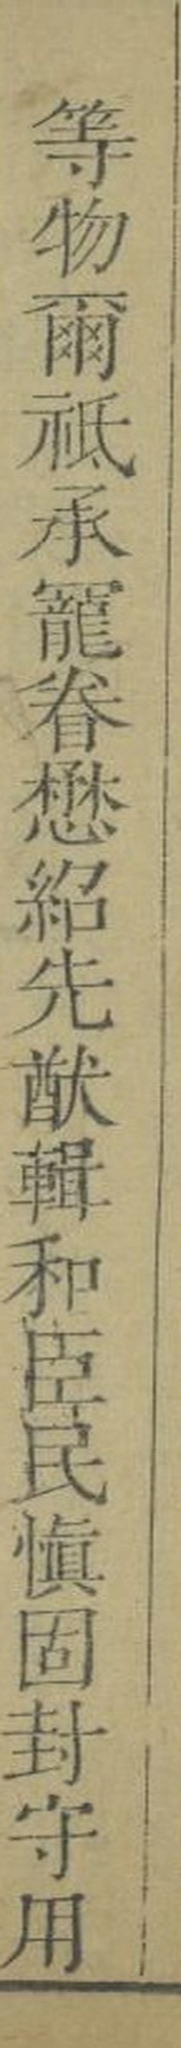等物爾祇承寵眷懋紹先猷輯和臣民愼固封守用
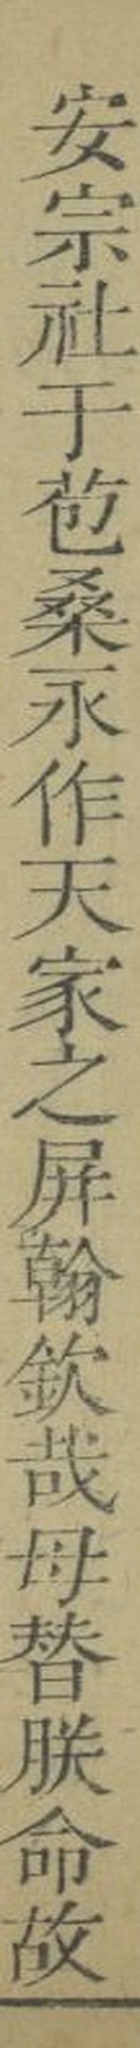安宗社于苞桑永作天家之屏翰欽哉母替朕命故
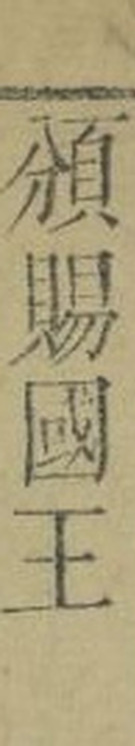領賜國王
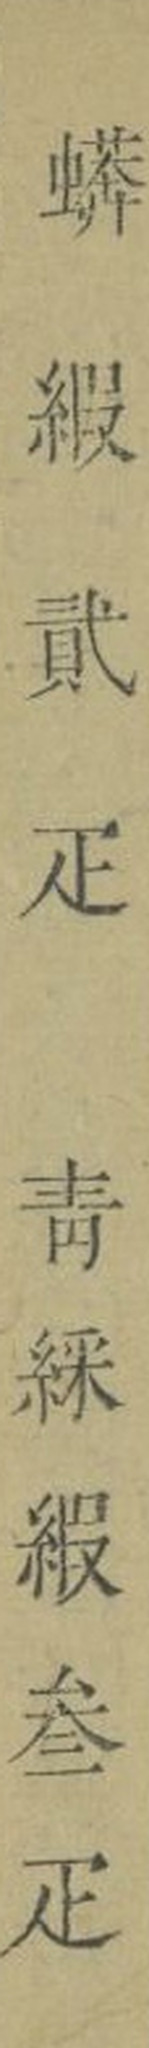蠎縀貮疋靑綵縀参疋
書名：中山伝信録 巻二
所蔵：University of the Ryukyus Library
